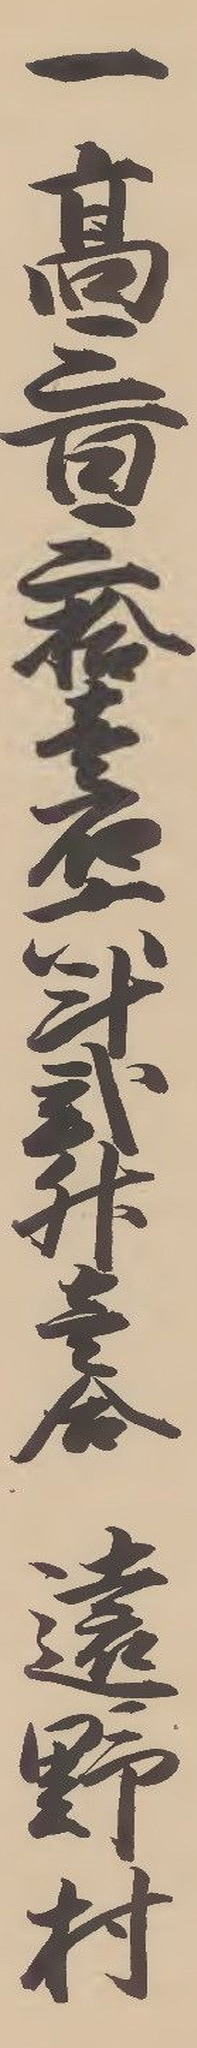一高三百三拾壱石六斗弐升壱合遠野村
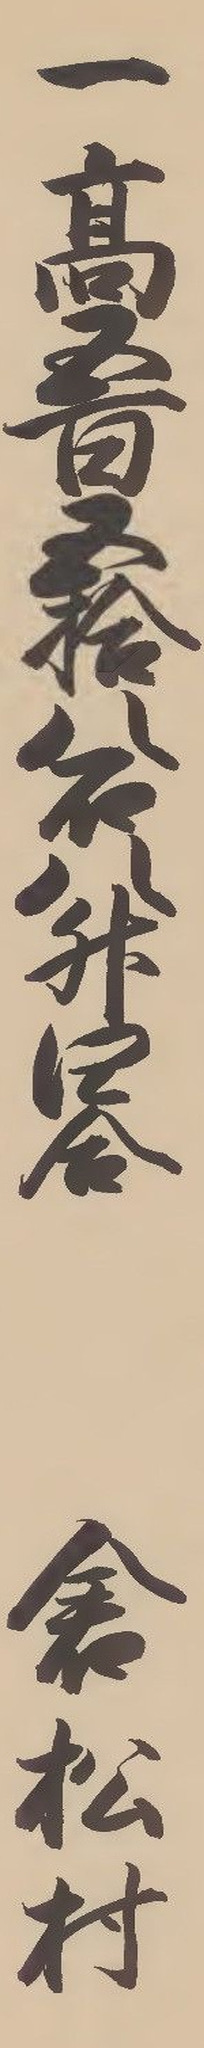一高五百五拾八石八升四合倉松村
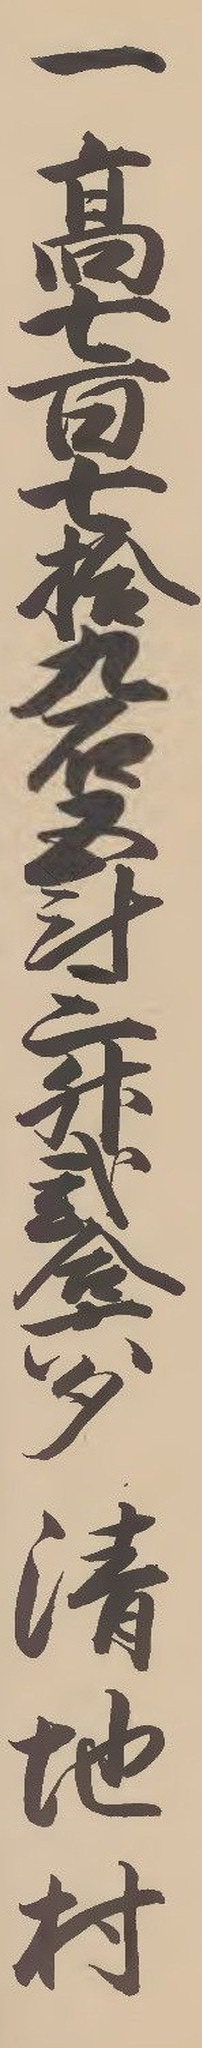一高七百七拾九石五斗三升弐合六勺清地村
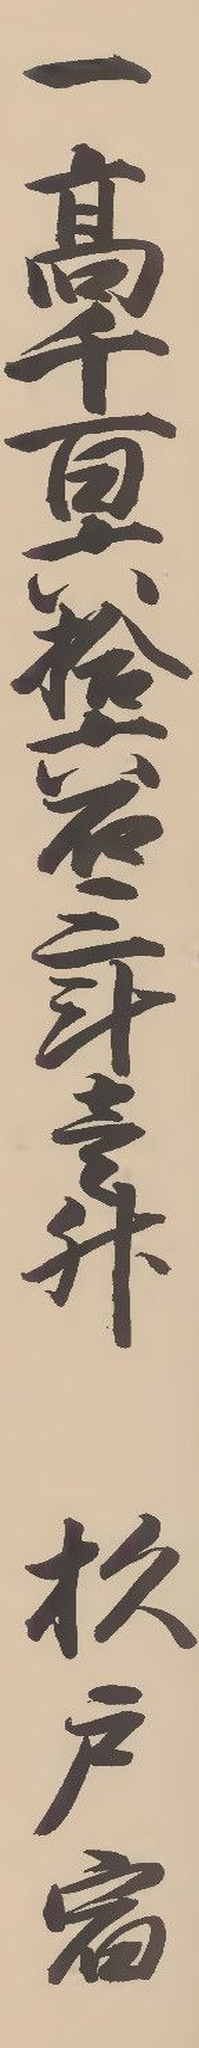一高千百六拾六石三斗壱升杉戸宿
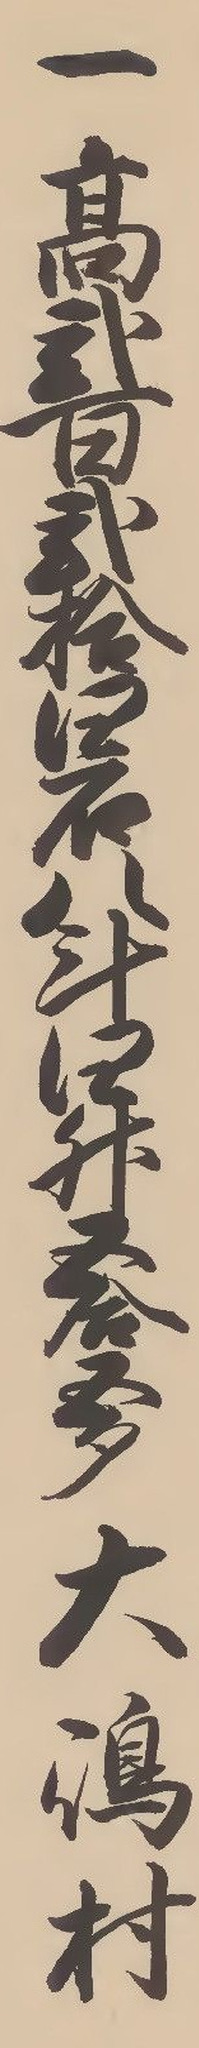一高弐百弐拾四石八斗四升五合五勺大嶋村
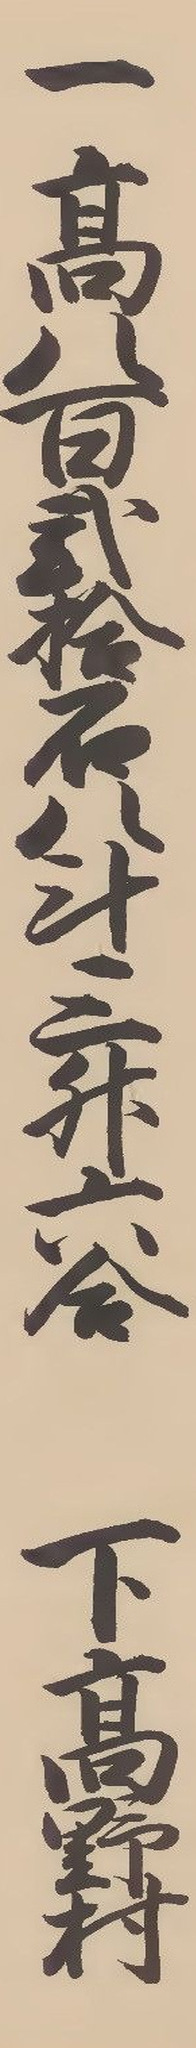一高八百弐拾石八斗三升六合下高野村
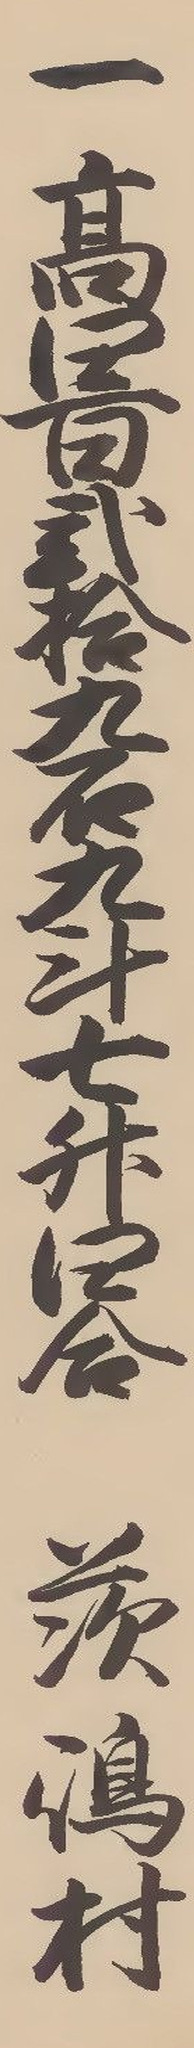一高四百弐拾九石九斗七升四合茨嶋村

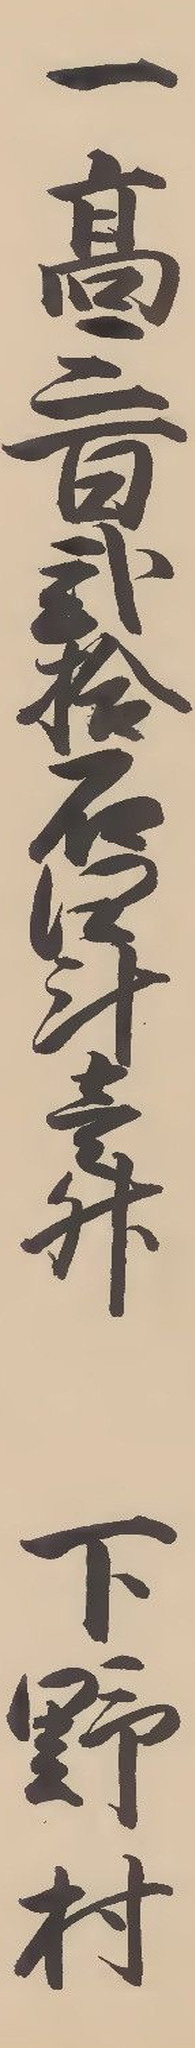一高三百弐拾石四斗壱升下野村
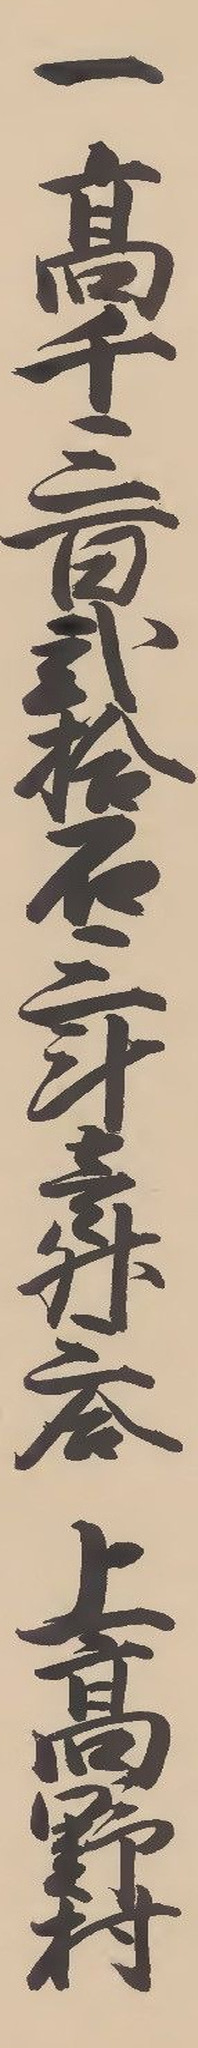一高千三百弐拾石三斗壱升三合上高野村
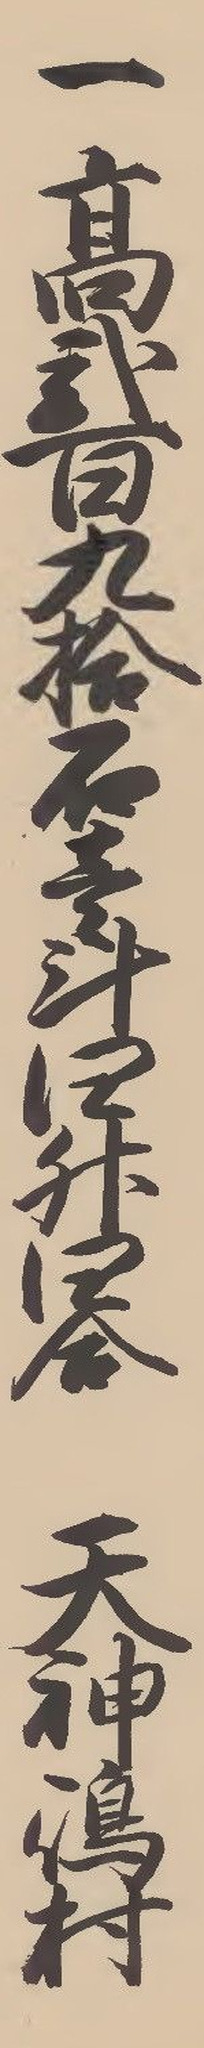一高弐百九拾石壱斗四升四合天神嶋村
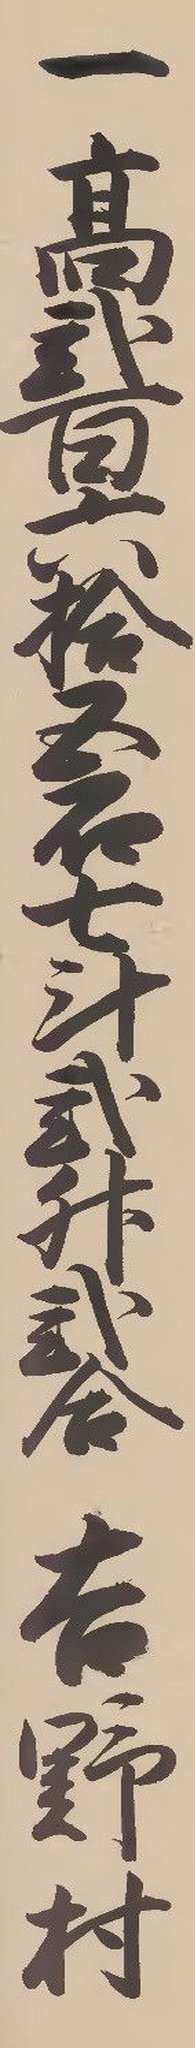一高弐百六拾五石七斗弐升弐合吉野村
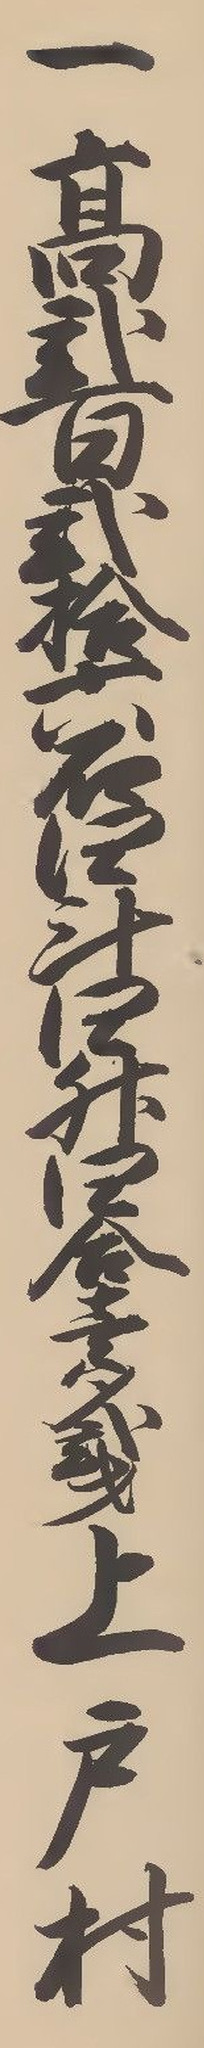一高弐百弐拾六石四斗四升四合壱勺弐才上戸村
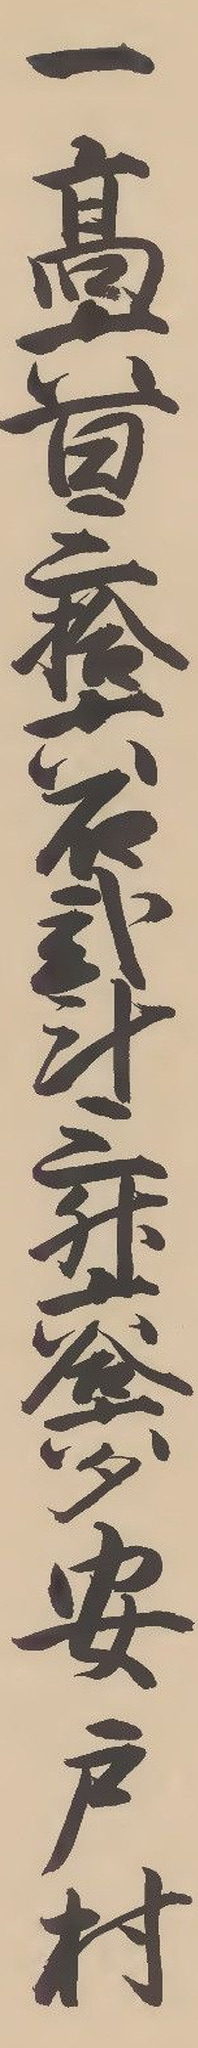一高六百三拾六石弐斗三升六合六勺安戸村
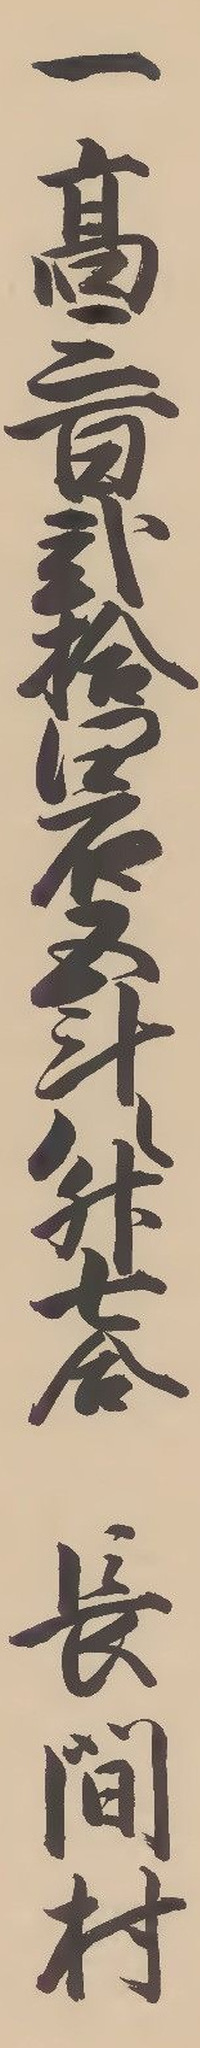一高三百弐拾四石五斗八升七合長間村

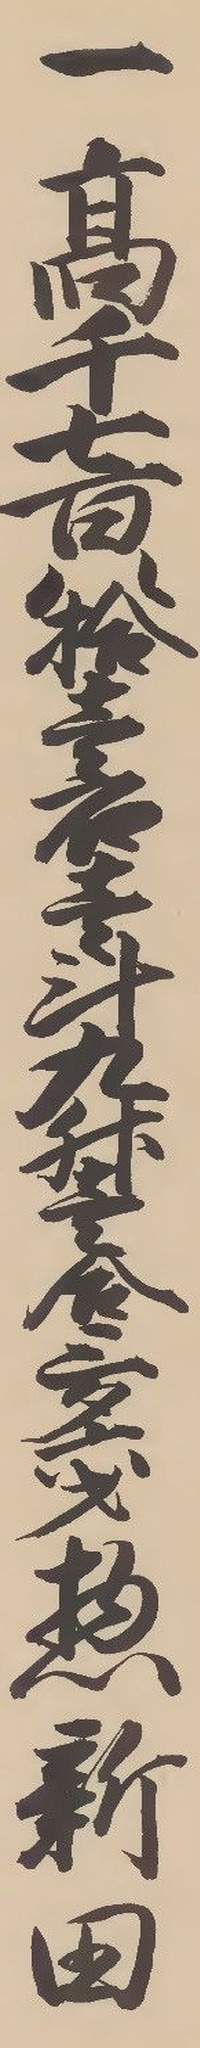一高千七百八拾壱石壱斗九升壱合三勺六才惣新田
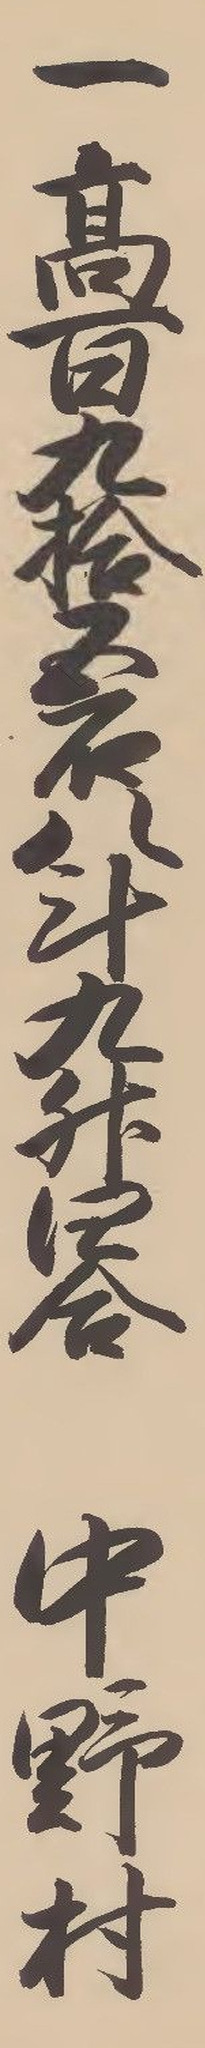一高百九拾五石八斗九升四合中野村
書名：武蔵国郷帳　下
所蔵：国立公文書館 National Archives of Japan
